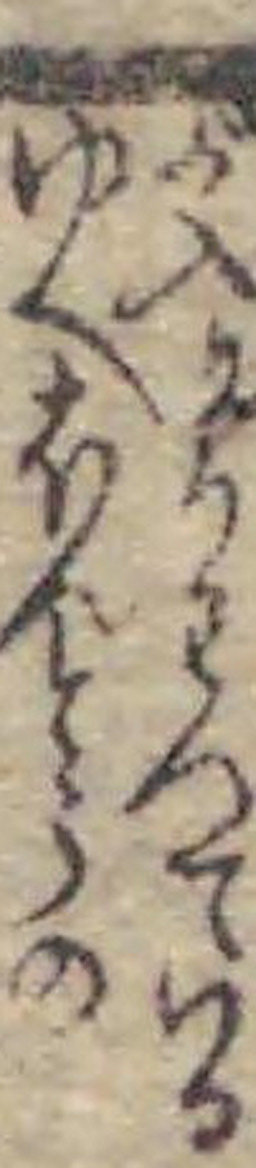ゆへほんとうの
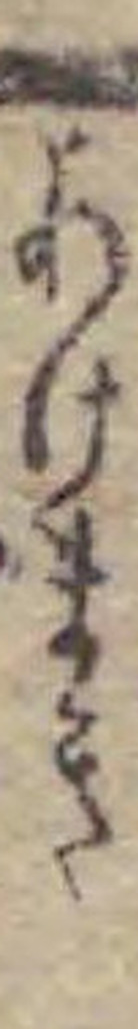あけまき
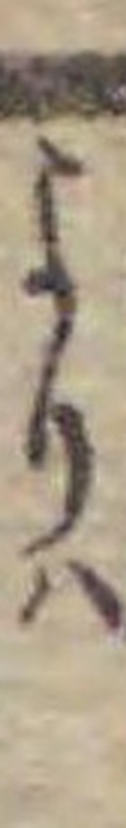よりは
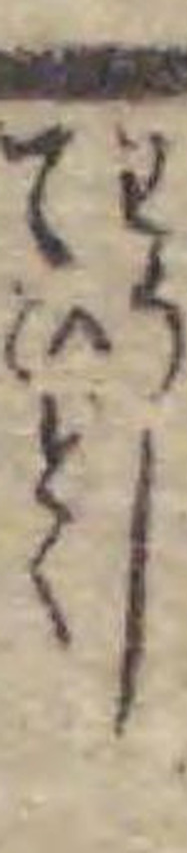てひとく
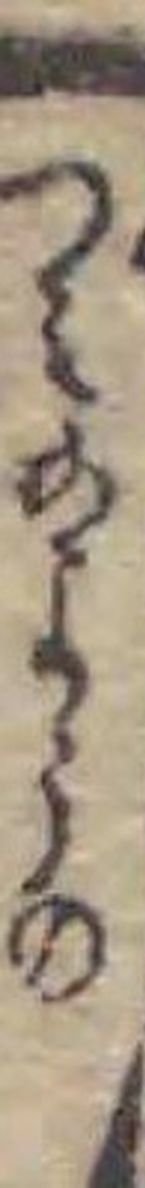つみのようの
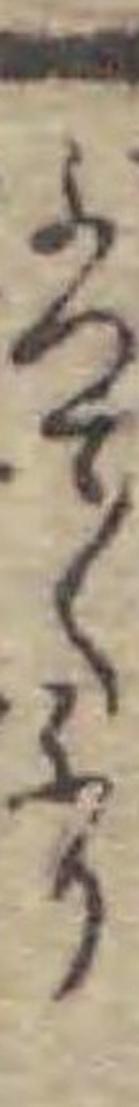ふつて〳〵ふり
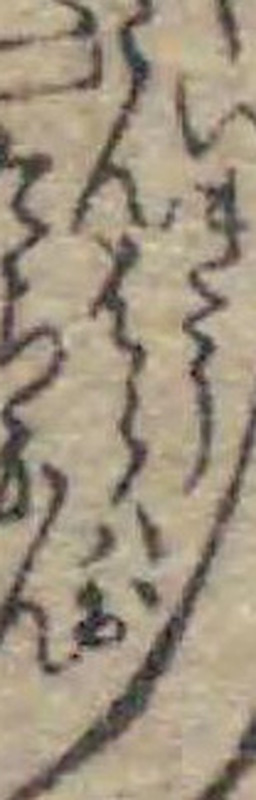たちなん
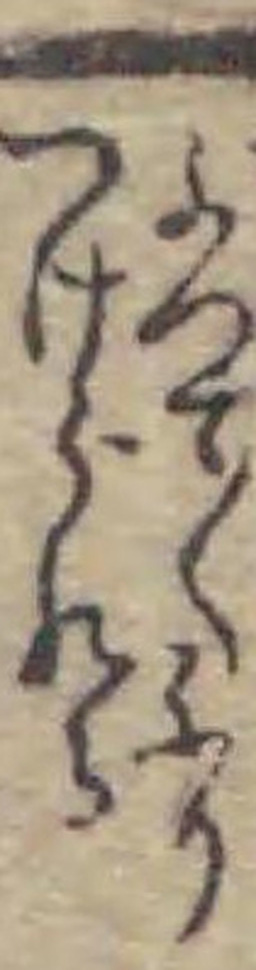つけられる
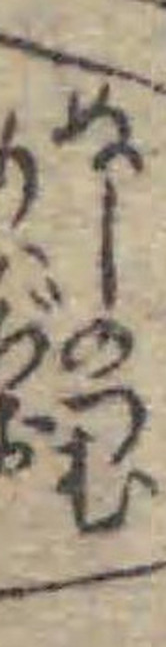ぬしのつむ
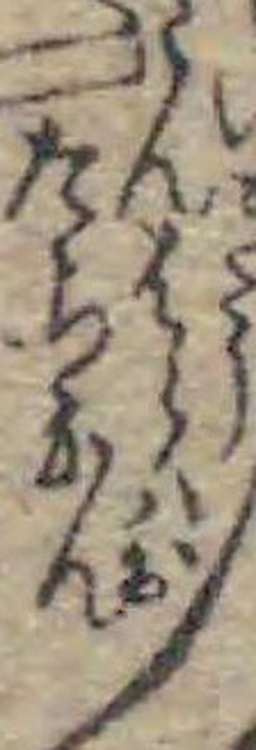たちなん
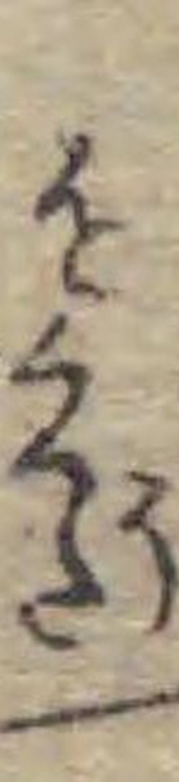をくつた
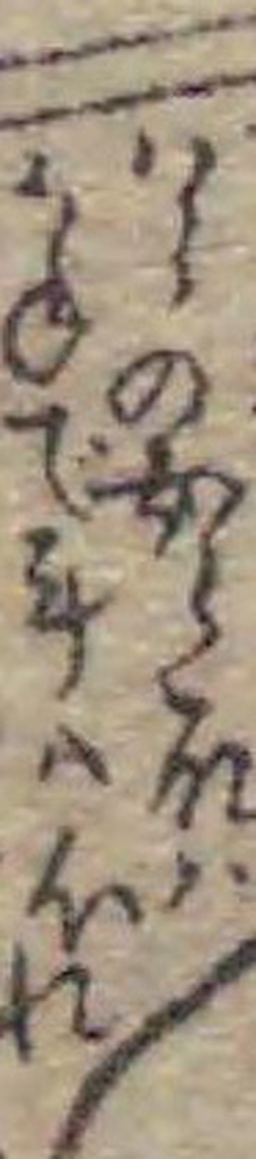かねで斗はほれ
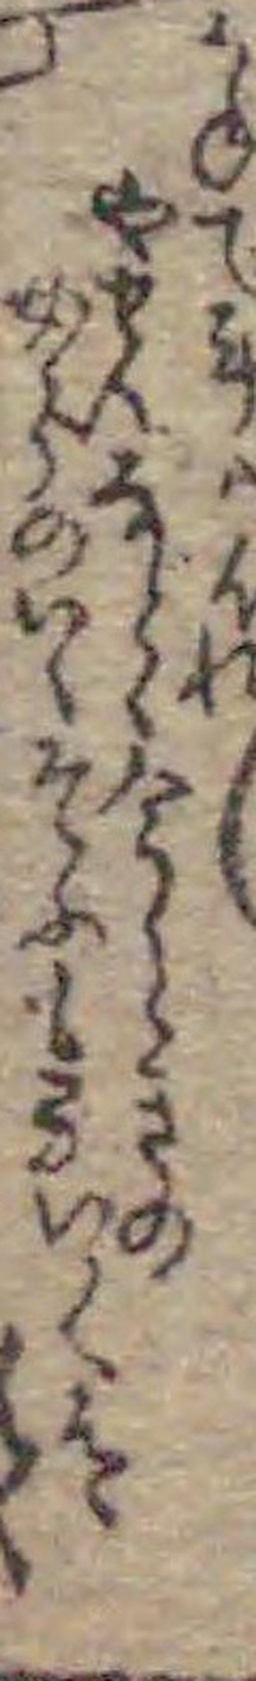女郎のいゝそふもないくを
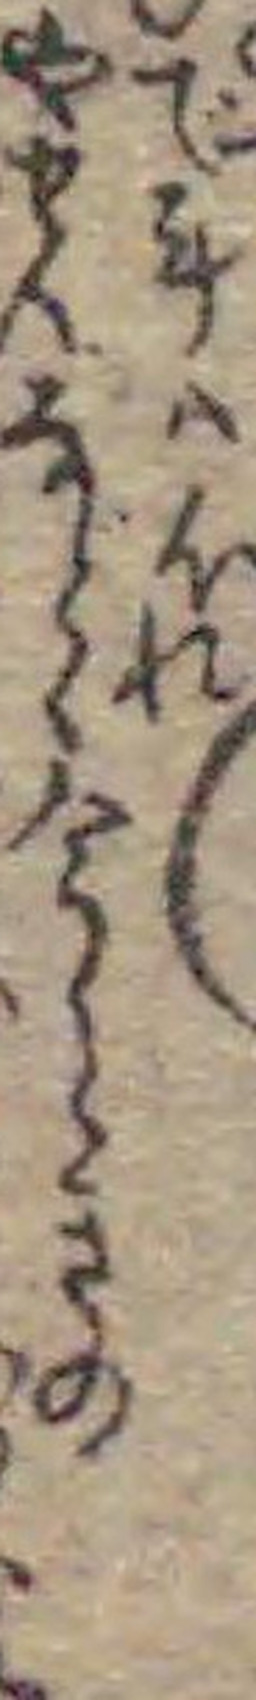やせんなとゝ今ときの
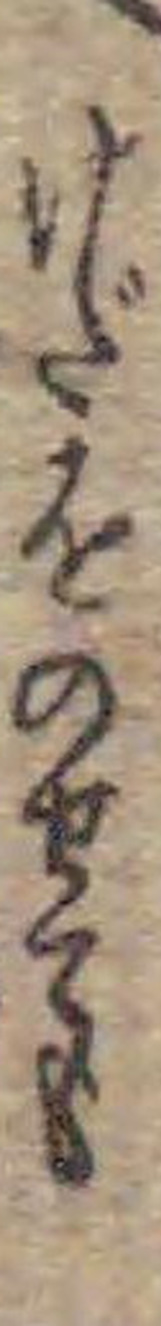げたをのせても
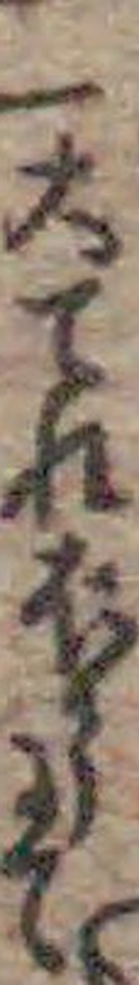大てれほうにて
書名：江戸花俳優贔屓 : 3巻
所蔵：国立国会図書館 National Diet Library, JAPAN
